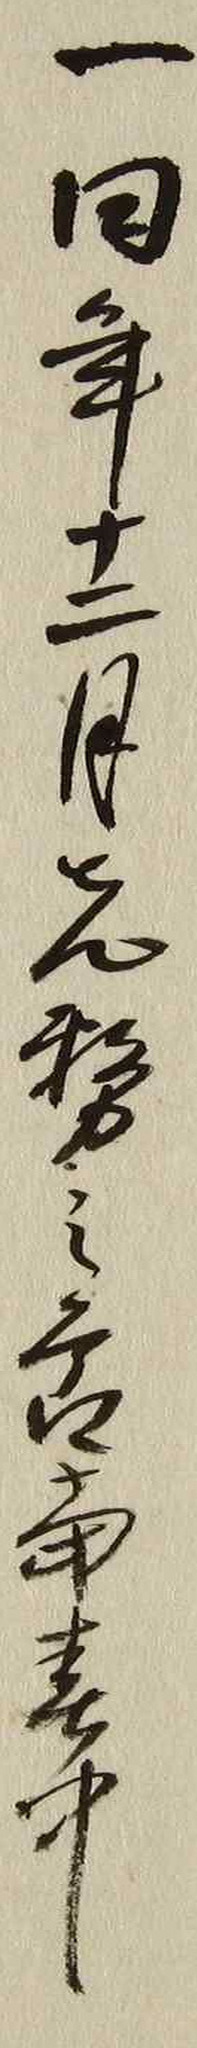一同年十二月先務之節当春中
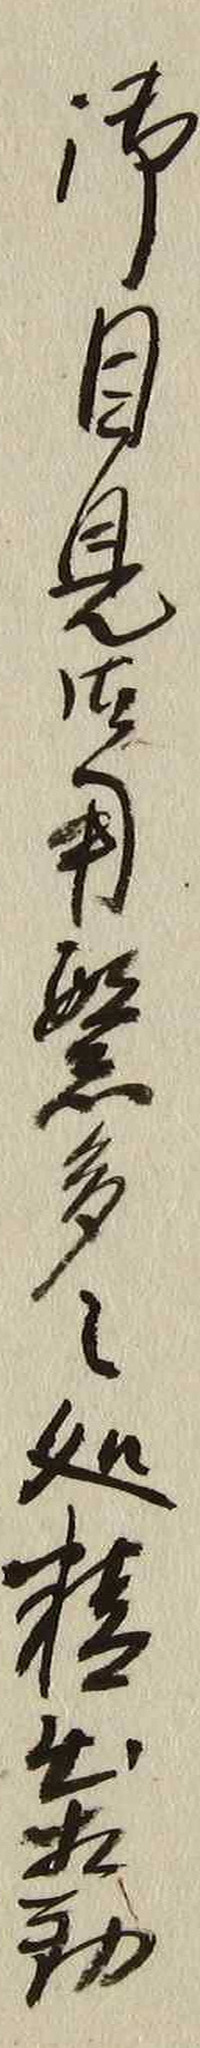御目見御用繁多之処精出相勤
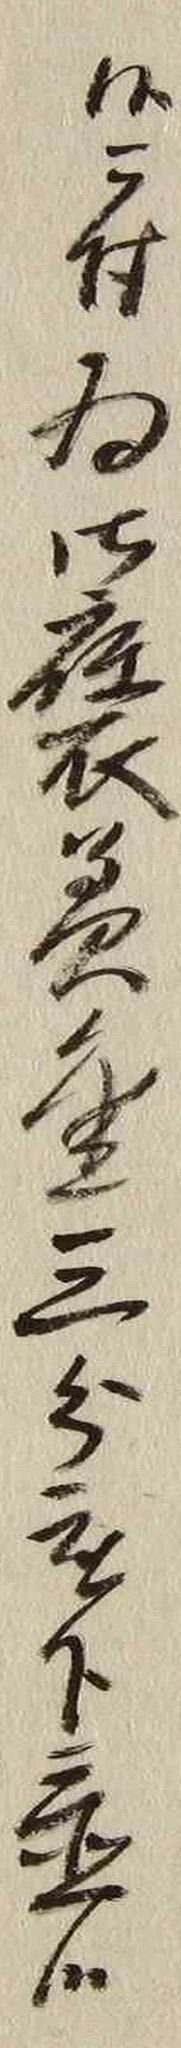候ニ付為御褒美金三分被下置候
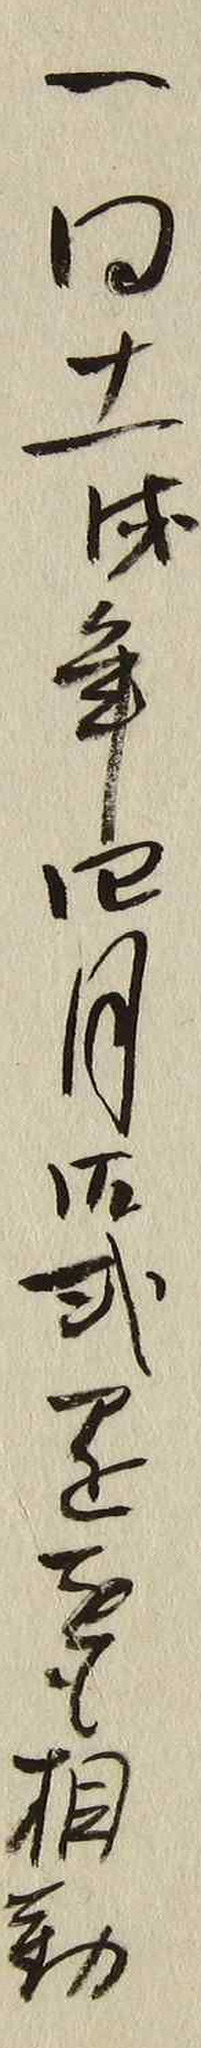一同十一戌年四月御式懸をも相勤
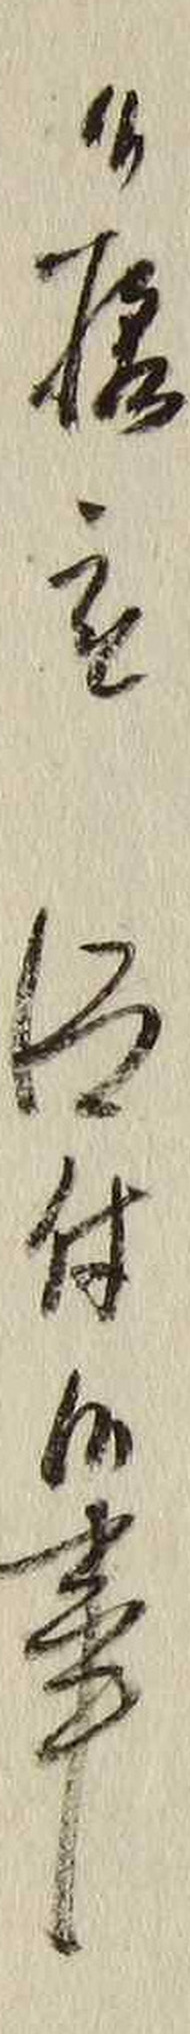候様被仰付候事
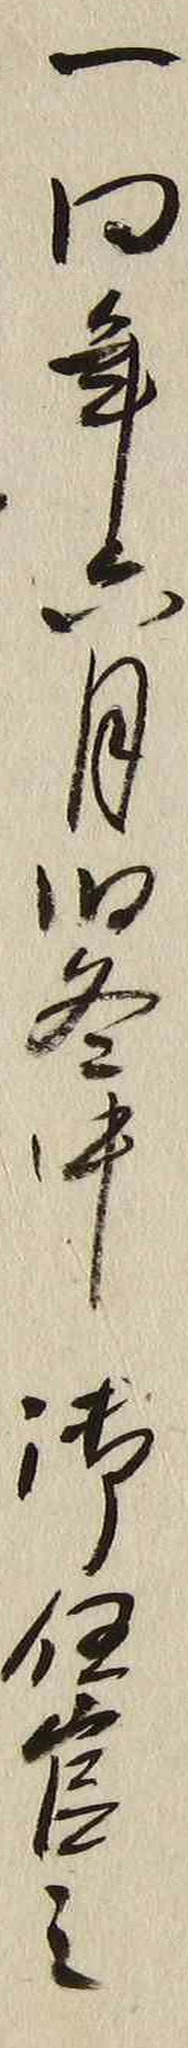一同年六月旧冬中御任官之
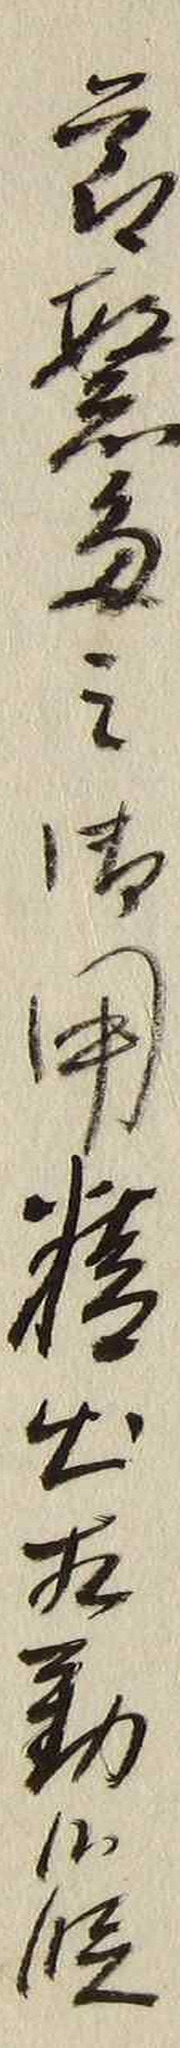節繁多之御用精出相勤候段
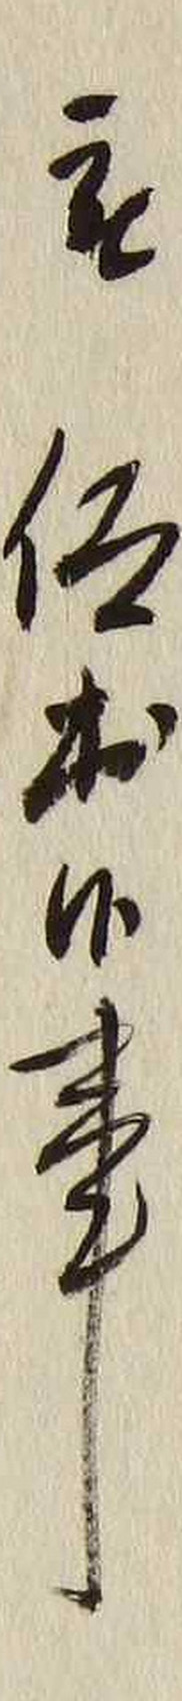被仰出候事
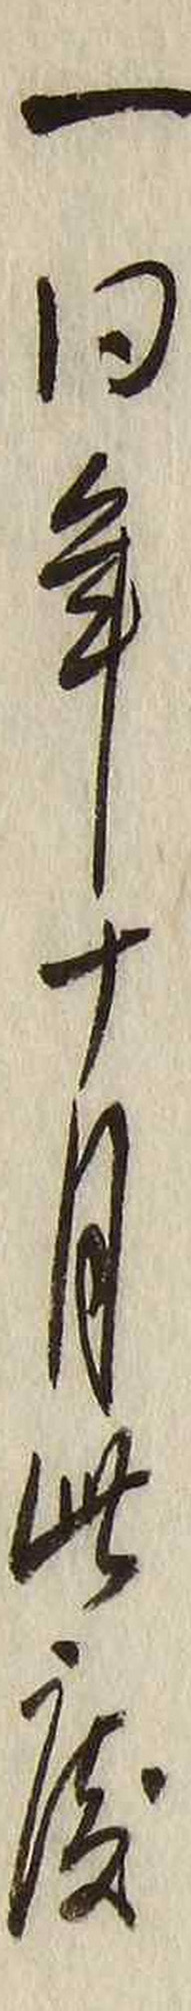一同年十月此度

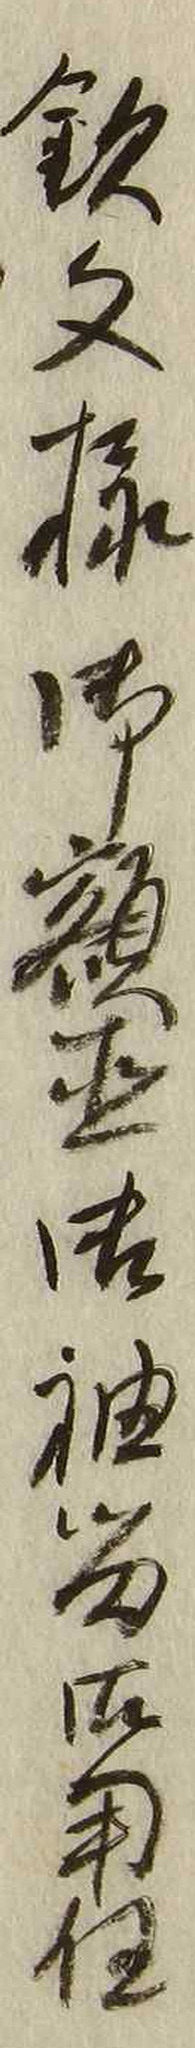欽文様御額直御袖留御用任
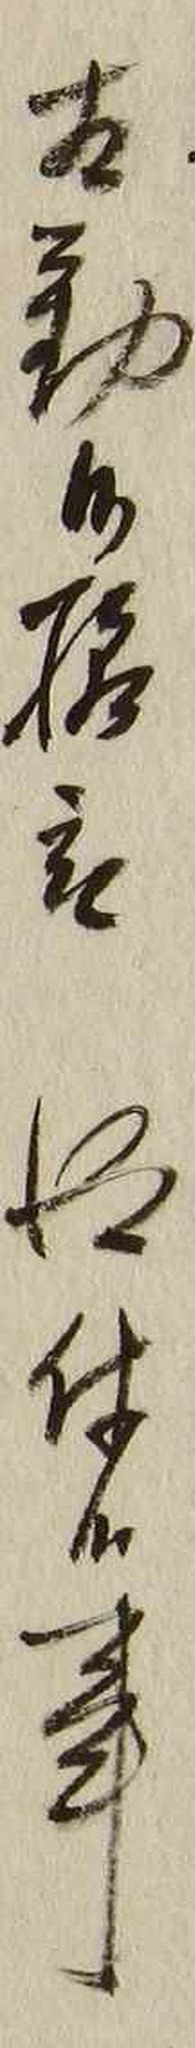相勤候様被仰付候事
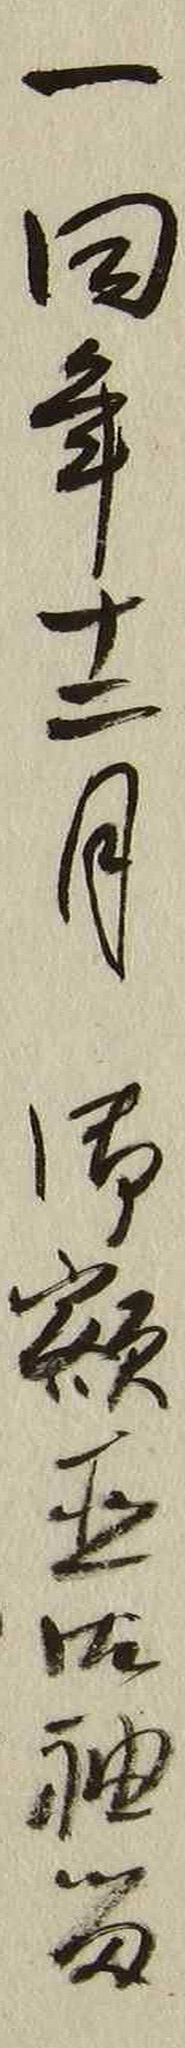一同年十二月御額直御袖留
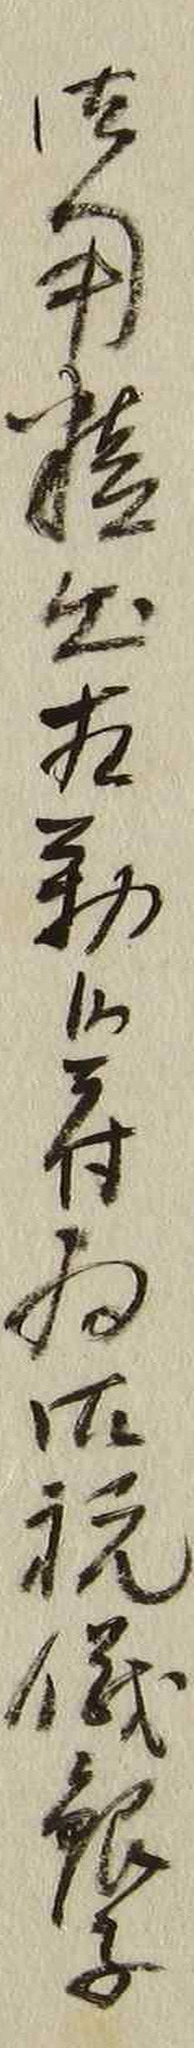御用精出相勤候ニ付為御祝儀銀子
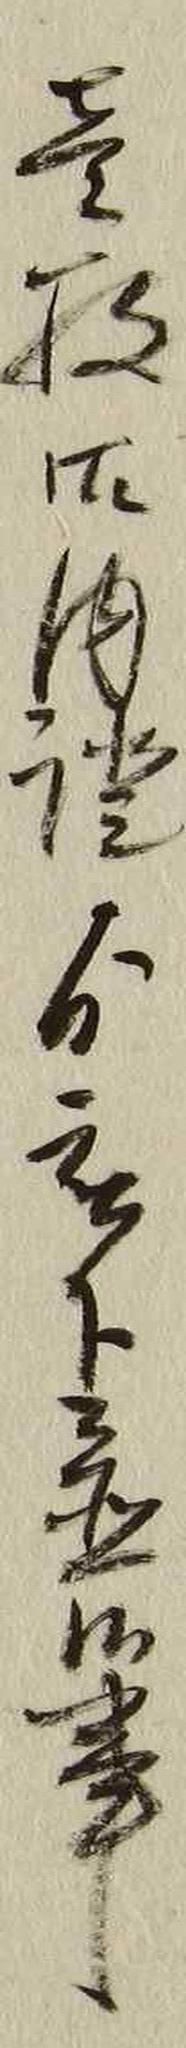壱枚御内証ゟ被下置候事
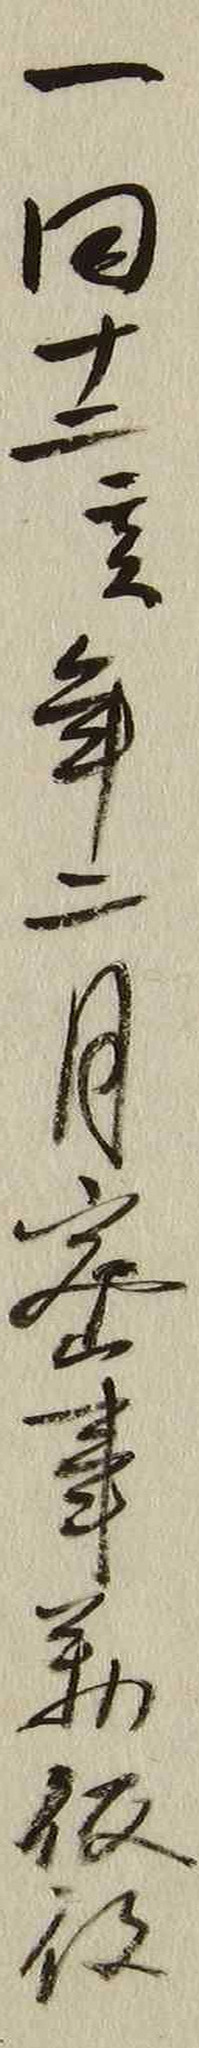一同十二亥年二月密事勤仮役
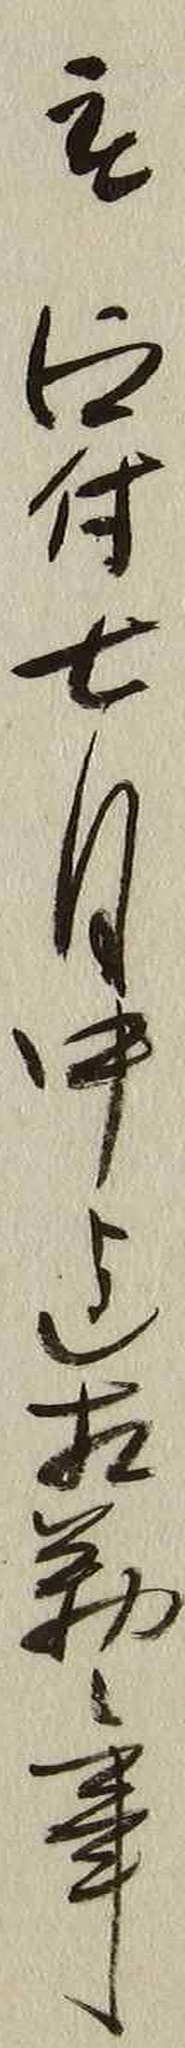被仰付七月中迄相勤候事
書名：諸士系譜　巻之353　す之部3
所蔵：会津若松市立会津図書館
